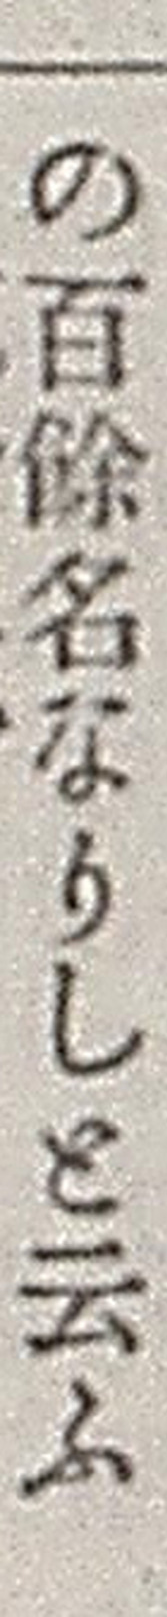の百余名なりしと云ふ
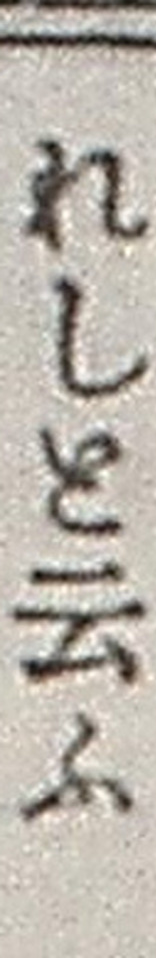れしと云ふ
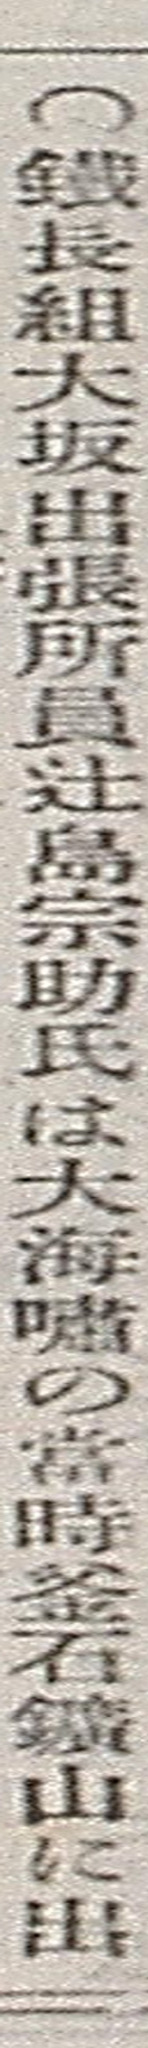○鉄長組大阪出張所員辻島宗助氏は大海嘯の当時釜石鉱山に出
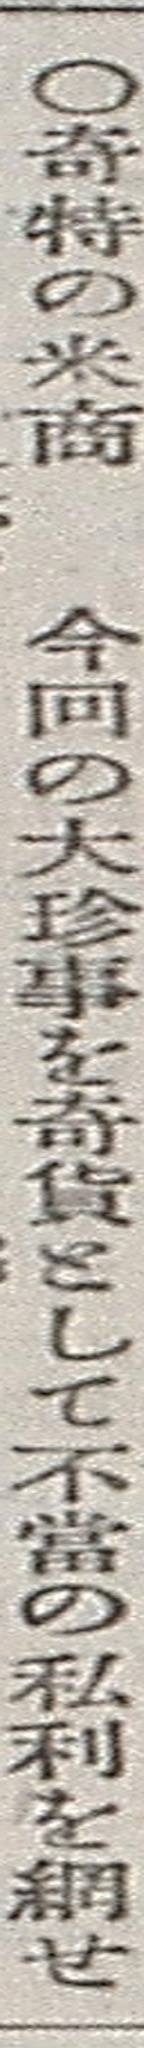○奇特の米商今回の大珍事を奇貨として不当の私利を網せ
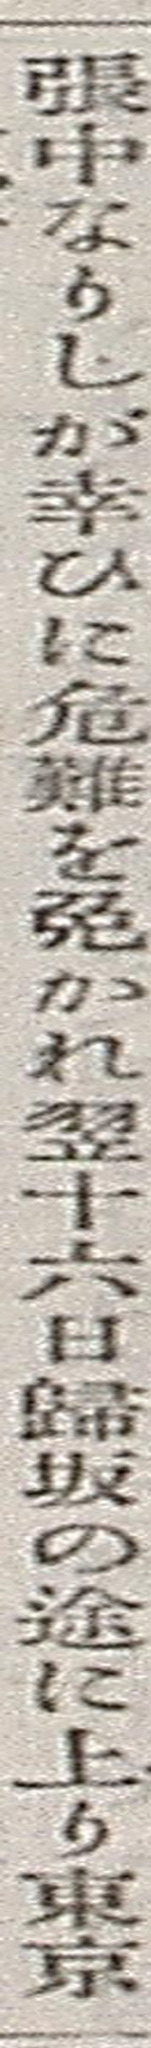張中なりしが幸ひに危難を免かれ翌十六日帰坂の途に上り東京
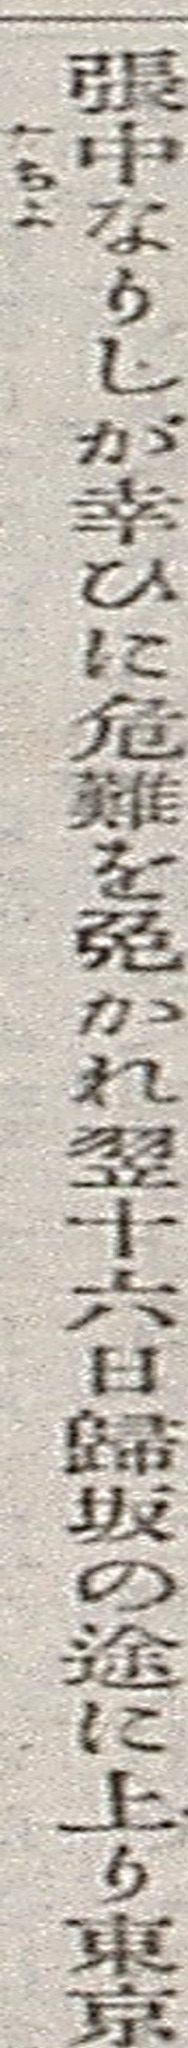張中なりしが幸ひに危難を免かれ翌十六日帰坂の途に上り東京
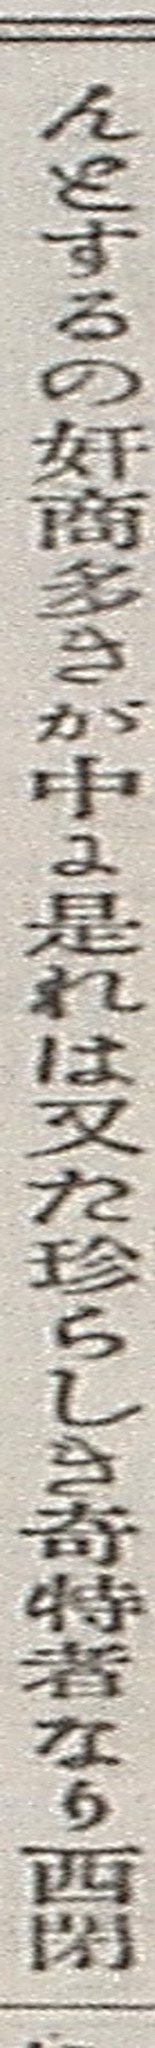んとするの奸商多きが中に是れは又た珍らしき奇特者なり西閉
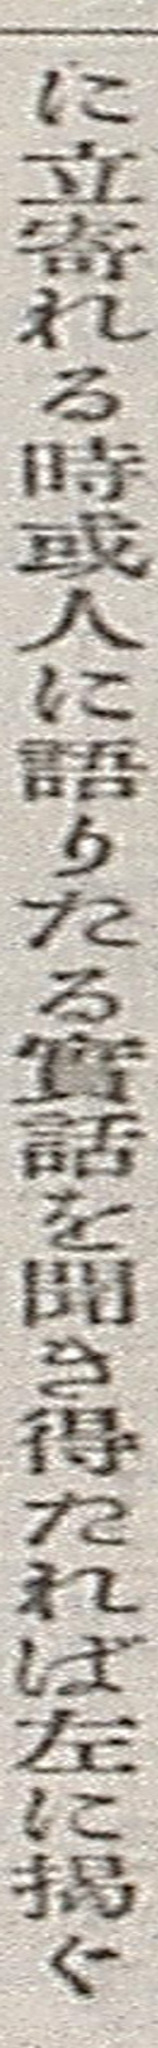に立寄れる時或人に語りたる実話を聞き得たれば左に掲ぐ
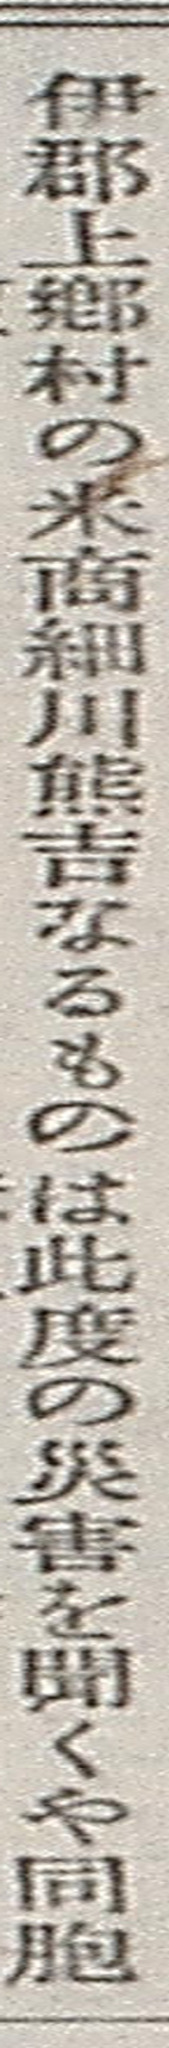伊郡上郷村の米商細川熊吉なるものは此度の災害を聞くや同胞
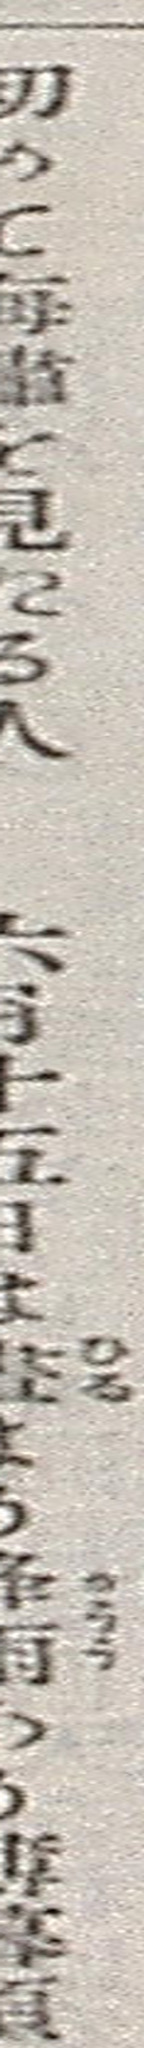初めて海嘯を見たる人六月十五日は昼より降雨あり薄暮頃
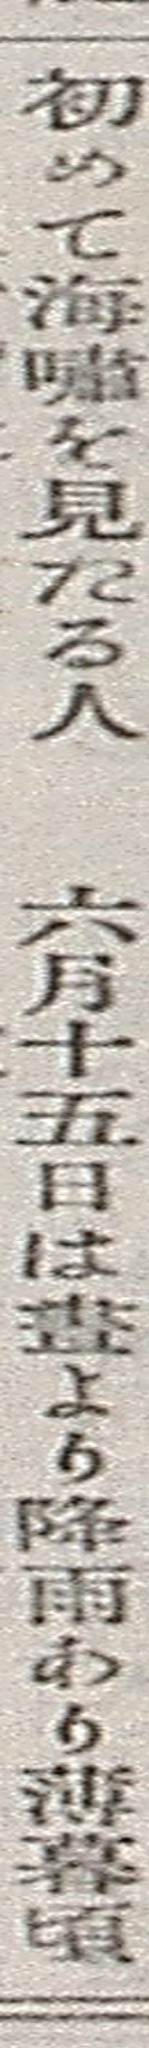初めて海嘯を見たる人六月十五日は昼より降雨あり薄暮頃
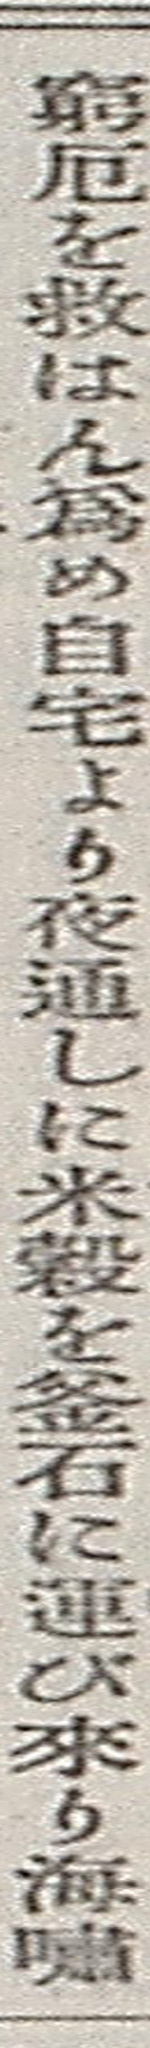窮厄を救はん為め自宅より夜通しに米穀を釜石に運び来り海嘯
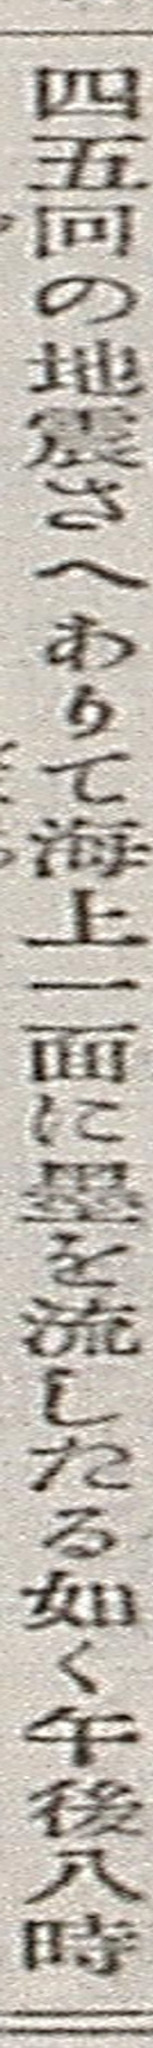四五回の地震さへありて海上一面に墨を流したる如く午後八時
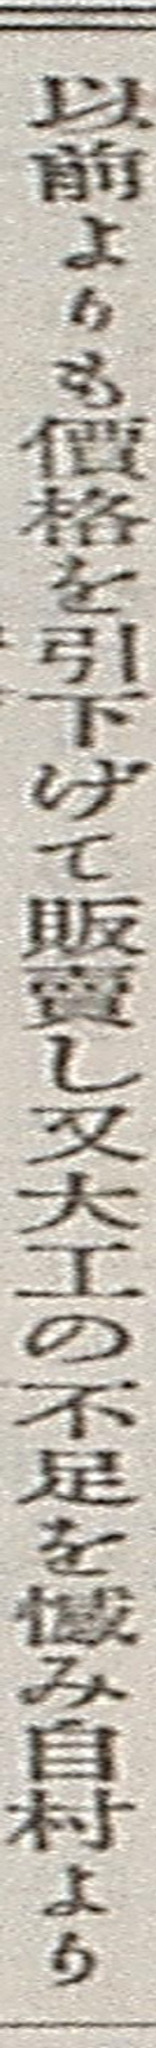以前よりも価格を引下げて販売し又大工の不足を憾み自村より
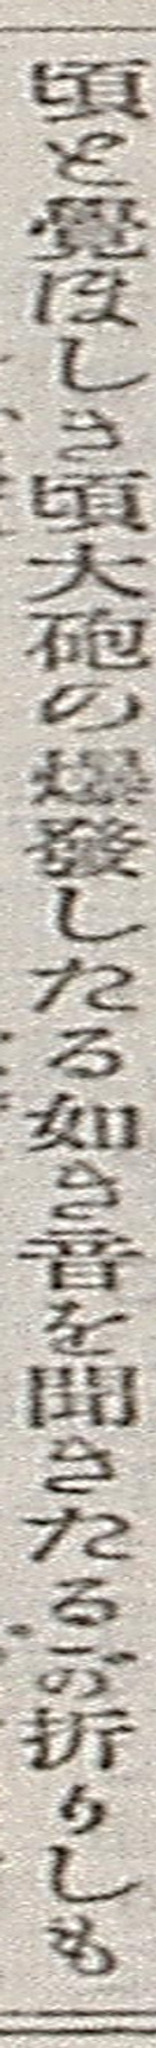頃と覚ほしき頃大砲の爆発したる如き音を聞きたるが折りしも
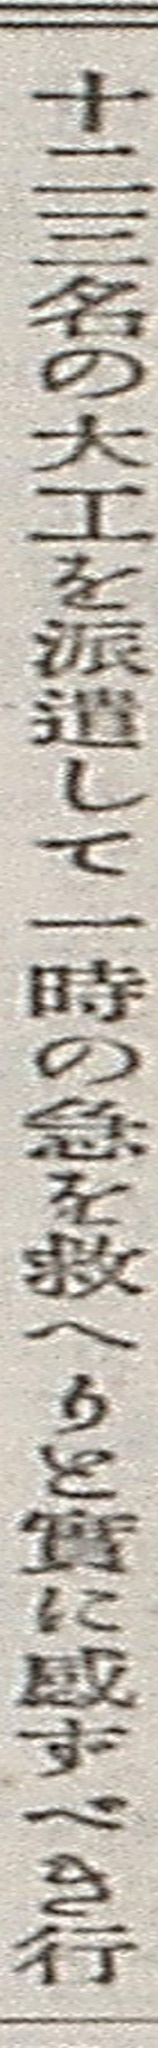十二三名の大工を派遣して一時の急を救へりと実に感ずべき行
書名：風俗畫報臨時増刊第百二十號　大海嘯被害録（下）
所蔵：東京大学地震研究所図書室 Earthquake Research Institute Library, The University of Tokyo, JAPAN
